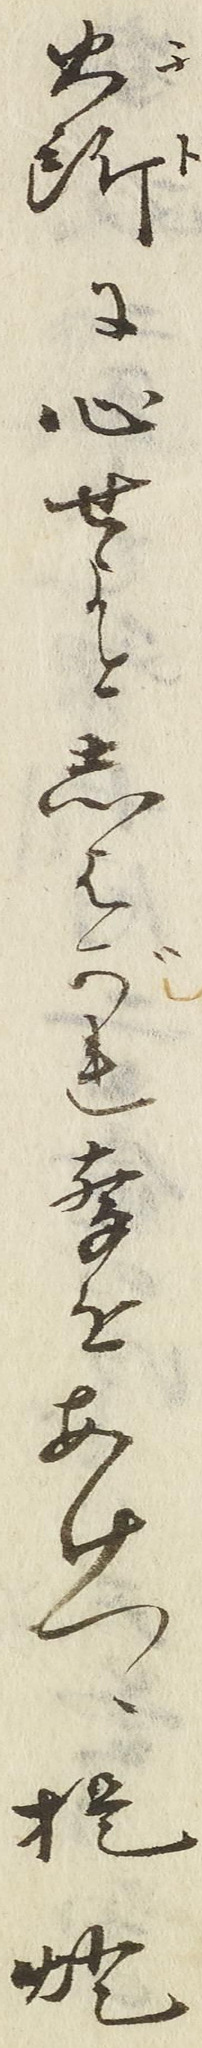火所に心せよとしはがれ声をあけつゝ提燈
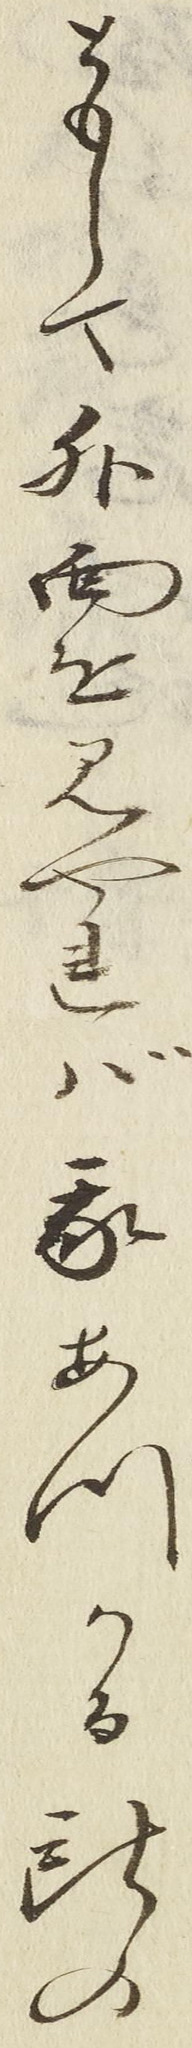ともして外面を見やれば我あづかる所の
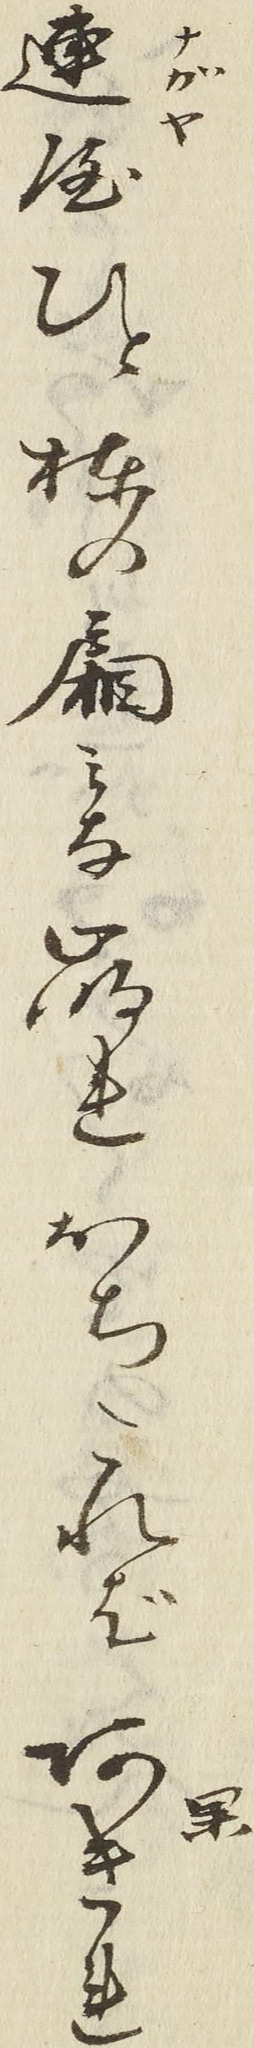連屋ひと棟の廂みな崩れおちたればあき果れ
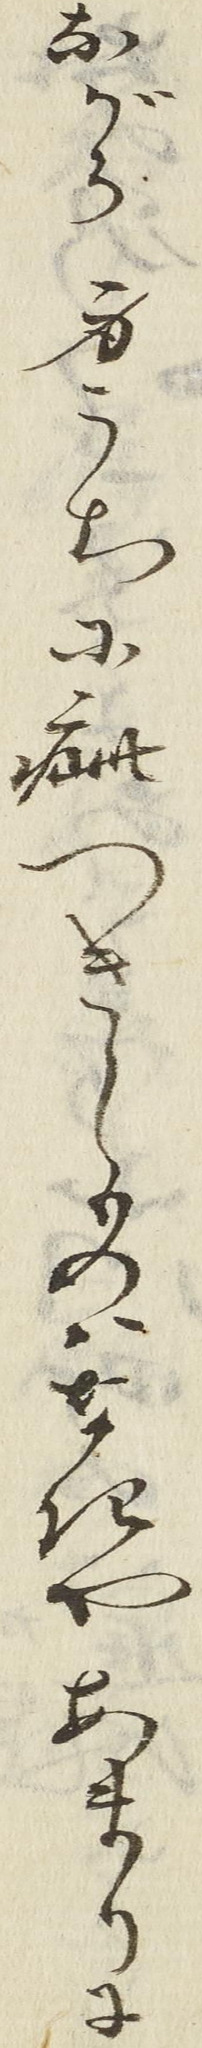ながら身うちに疵つきしものはなきやあまりに
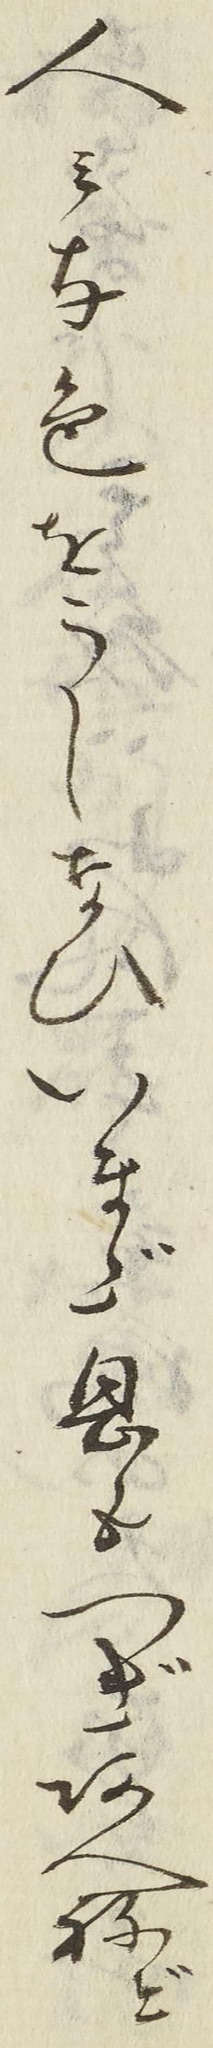人みな色をうしなひいまだ息もつぎあへねど
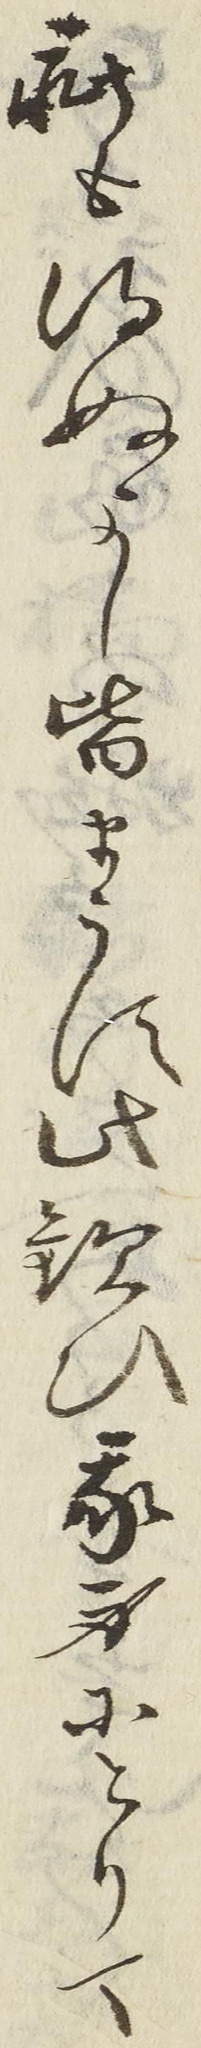疵も得ぬよし皆まうす此歓ひ我身にとりて
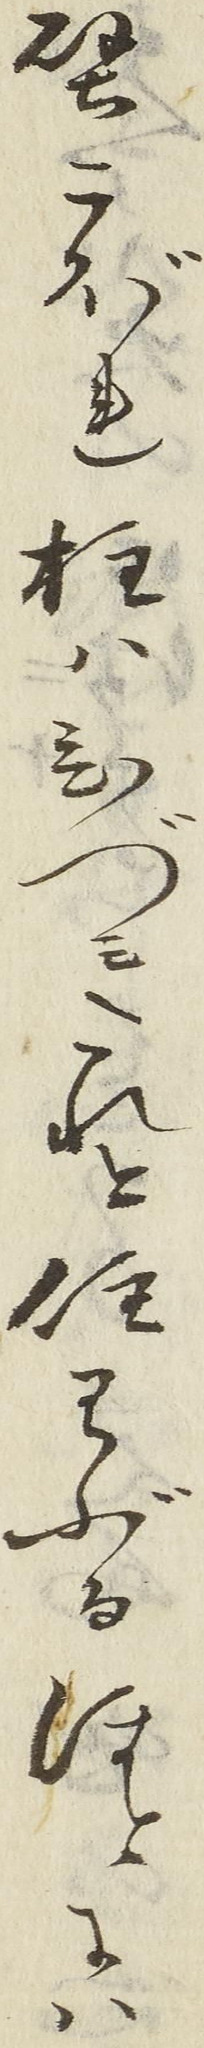壁こぼれ柱はひづみ曲たれと住わぶるほとには
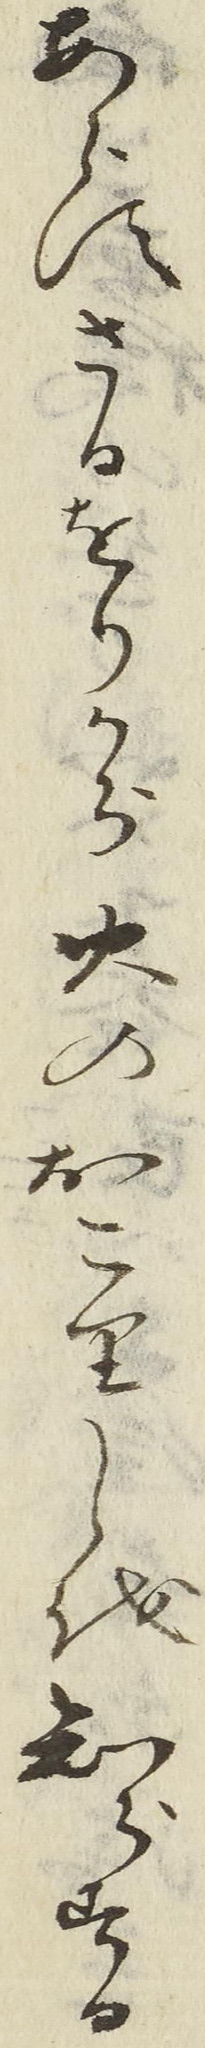あらすさるをりから火のおこりしを知らする
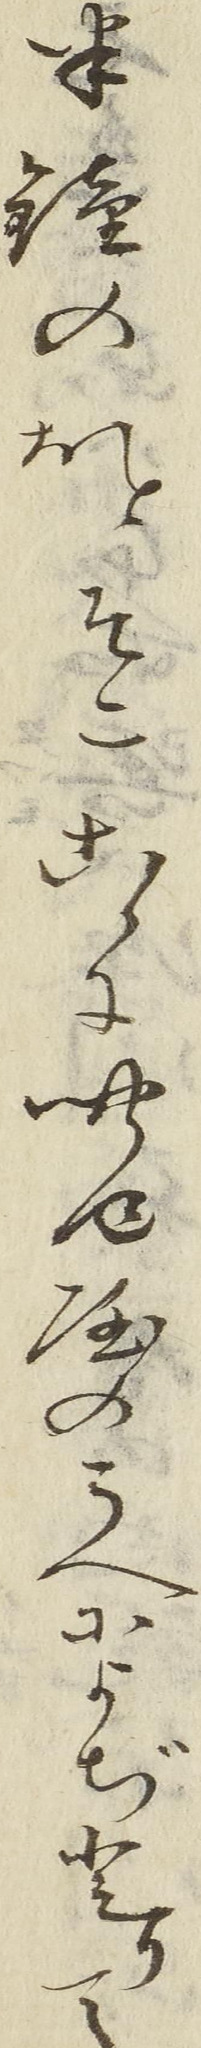半鐘のおとそここゝに聞ゆ屋のうへによぢ登りて

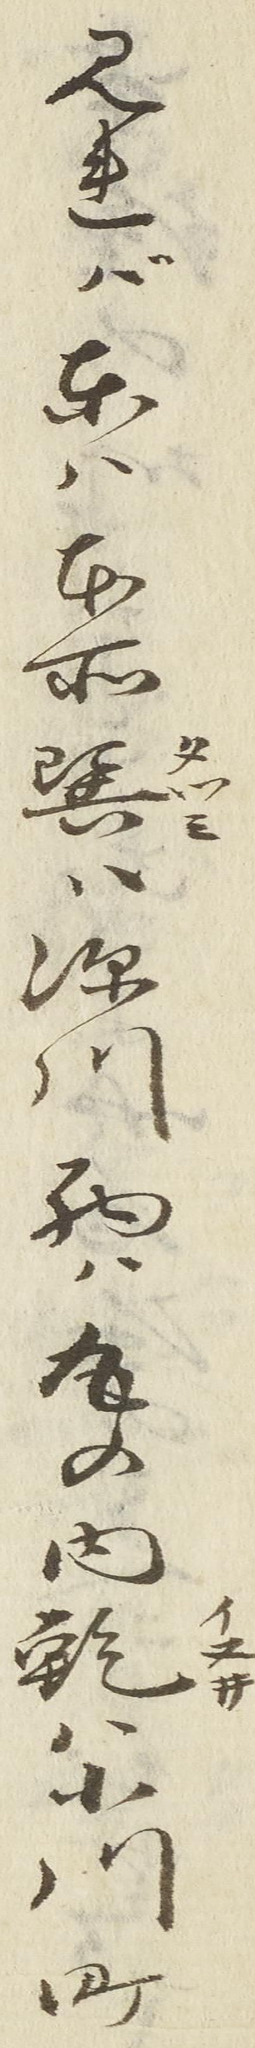見れば東は本所巽は深川西は丸の内乾は小川町
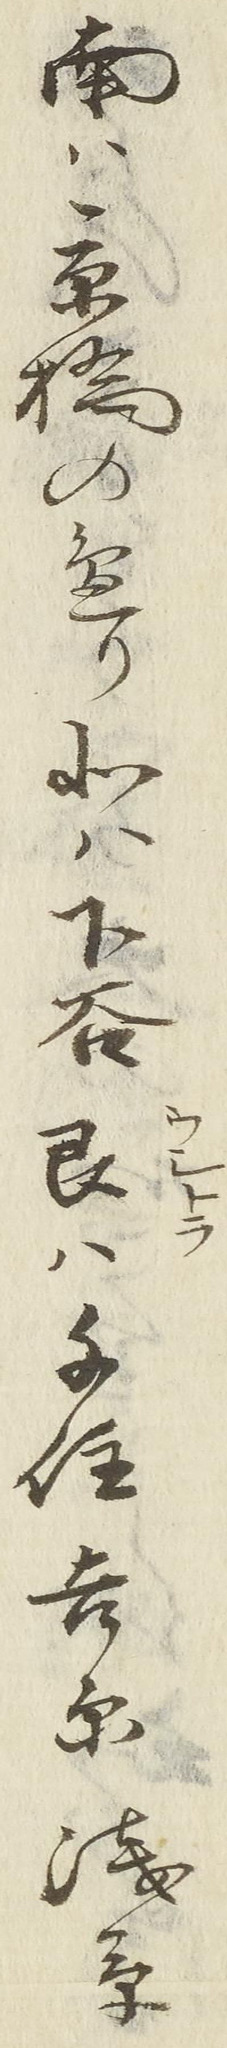南は京橋の辺り北は下谷艮は千住吉原浅草
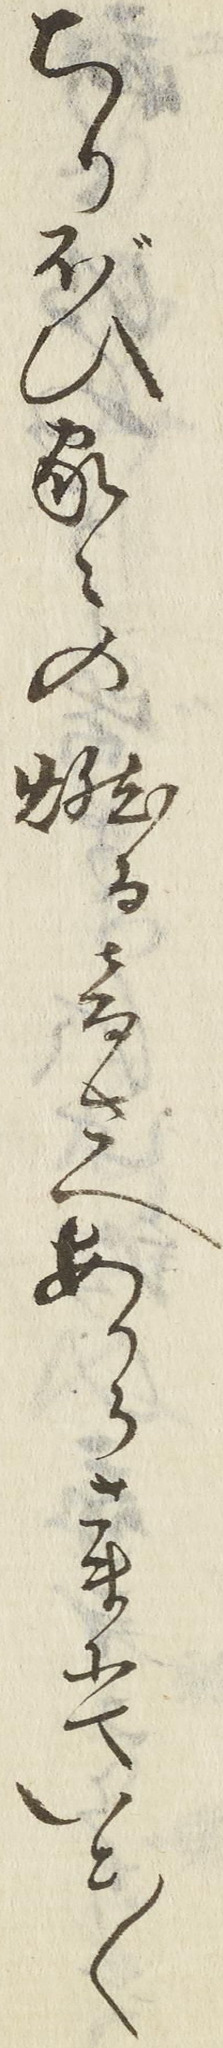ちりぼひ家〻の燃る音さへあからさまにていと〳〵
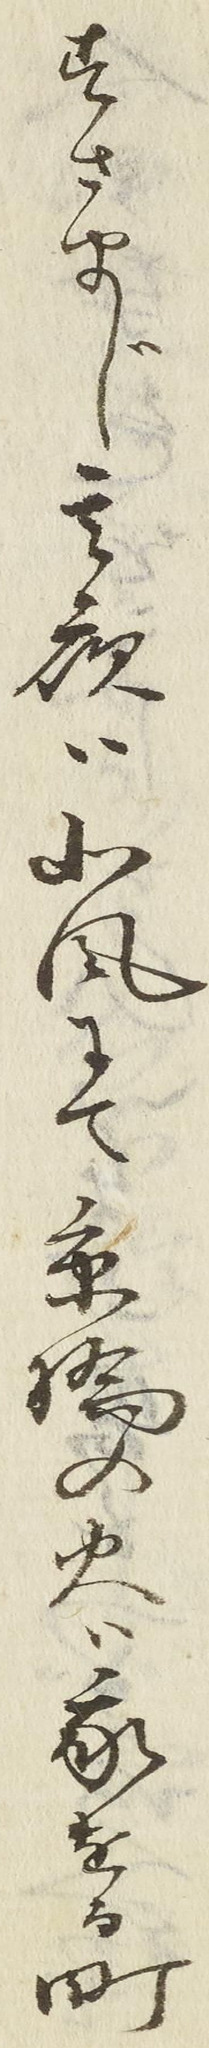すさまじ其夜は北風にて京橋の火は我をる町
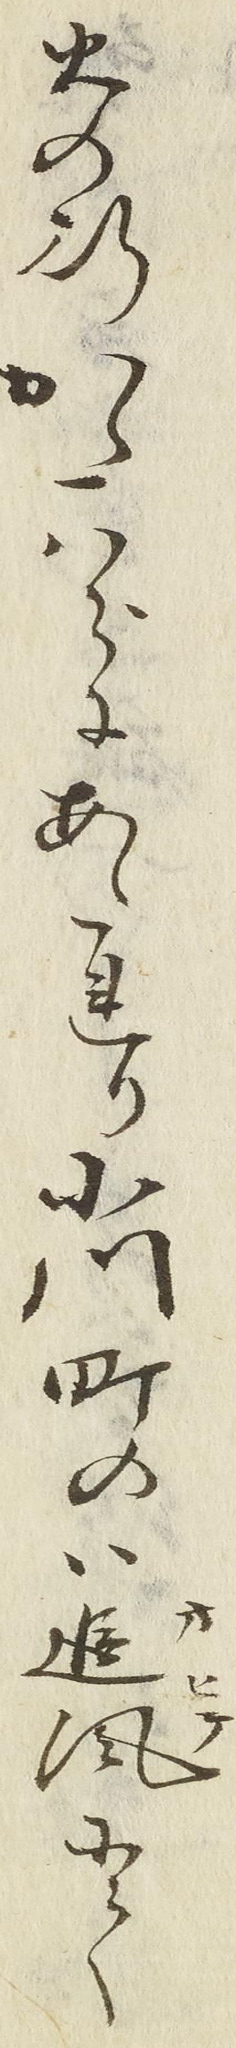火の行かたはらにあたれり小川町のは追風にて
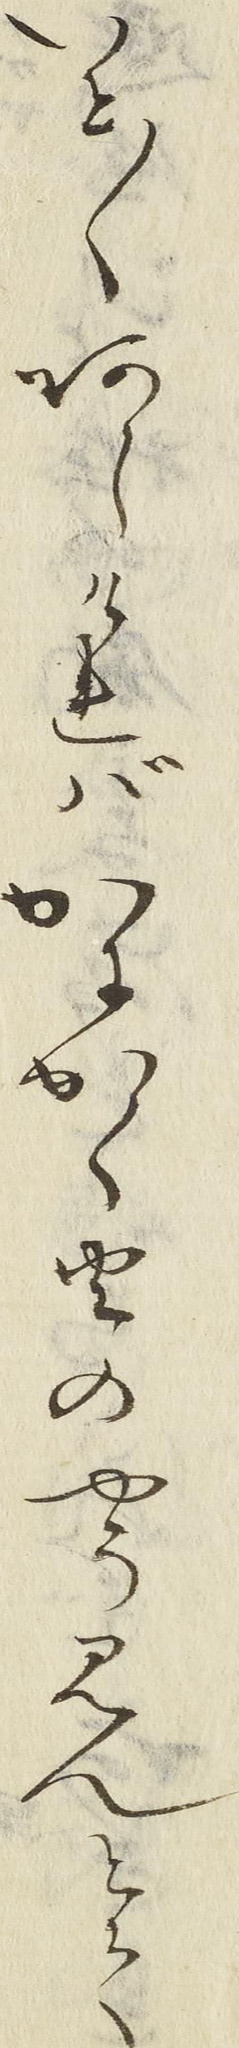いと〳〵あしければかにかく火のやう見んとて
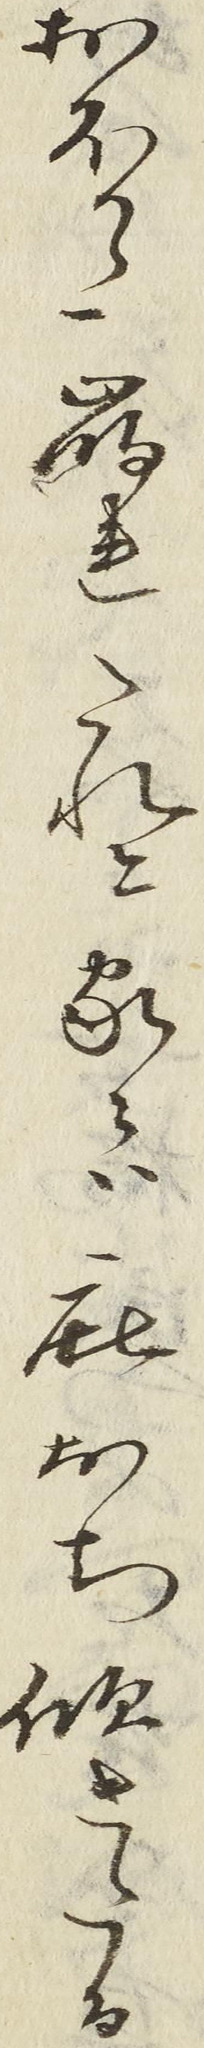おほかた崩れたれと家〻は庇おち傾きたる
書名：やぶれ窓の記　全
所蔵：東京大学地震研究所図書室 Earthquake Research Institute Library, The University of Tokyo, JAPAN
